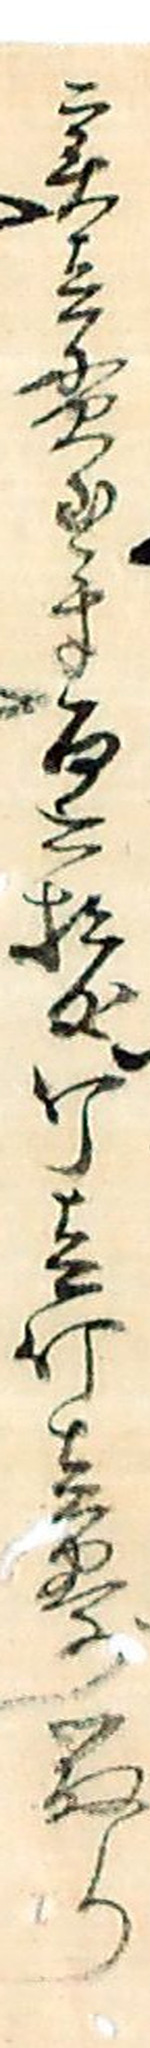実壱貫匁に付百六拾匁斤壱斤壱歩留り
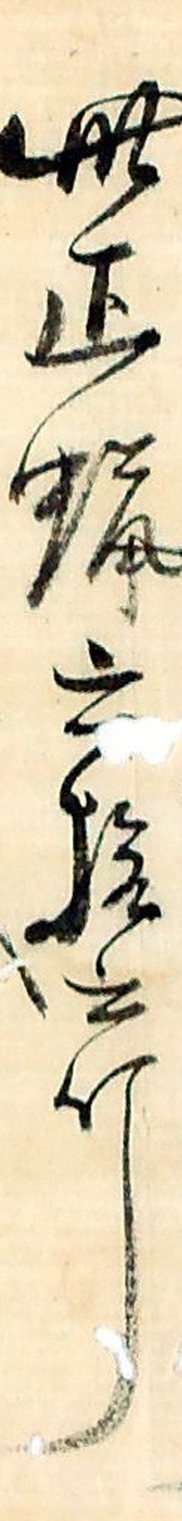此正蝋六拾六斤
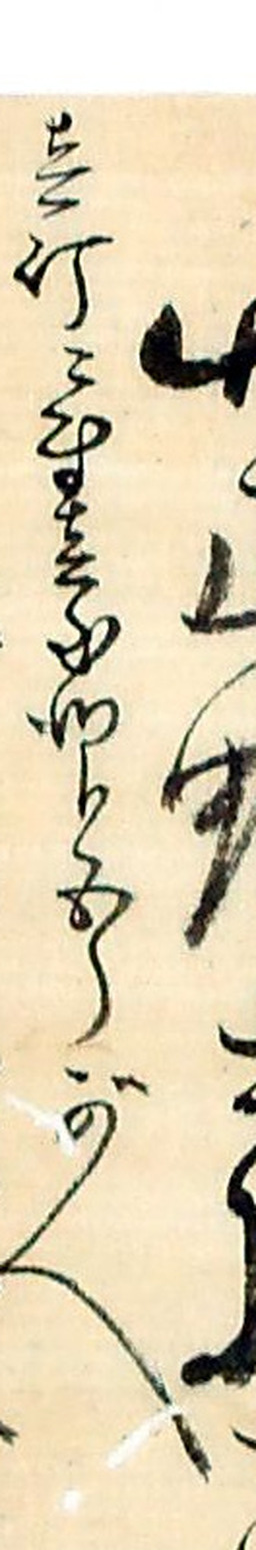壱斤に付壱匁弐分五りがへ
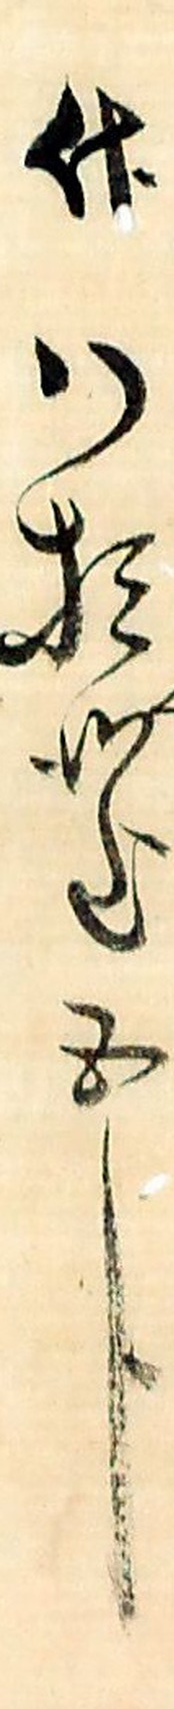代八拾弐匁五分
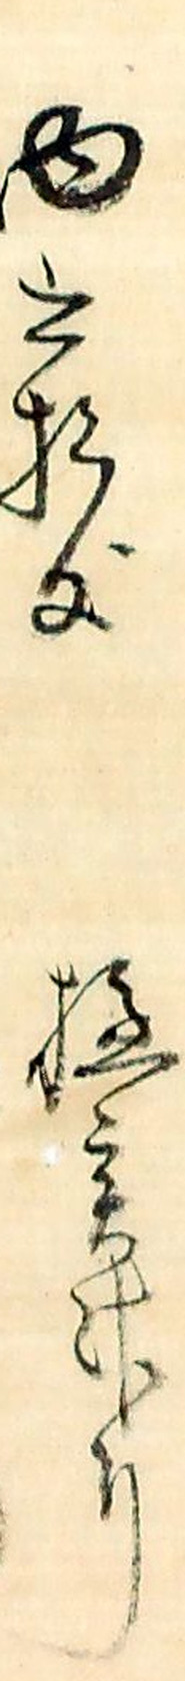内六拾匁櫨実代引
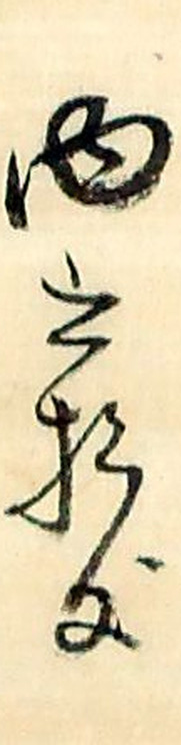代六拾匁
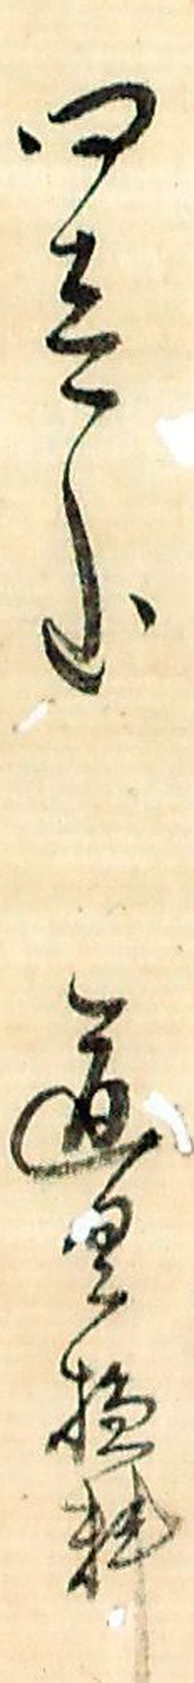同壱匁道具損料
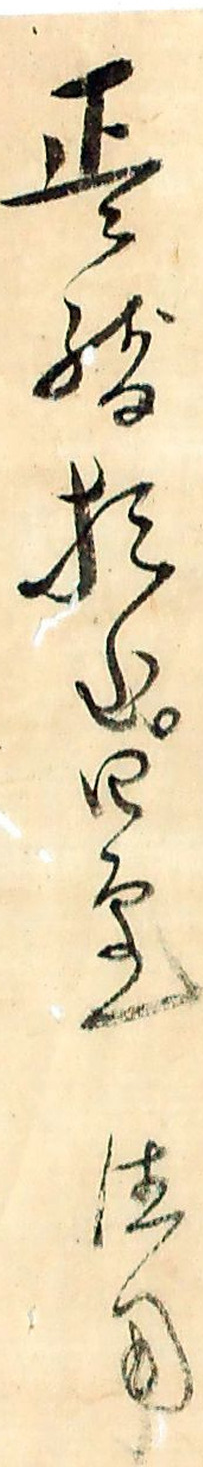正ミ残拾匁。四厘徳用

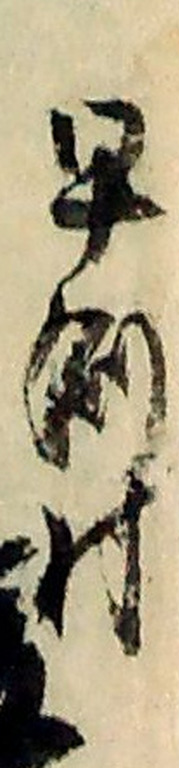早淵村
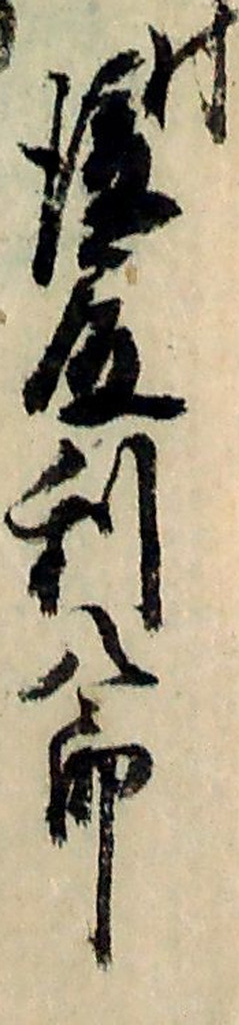後藤利八郎
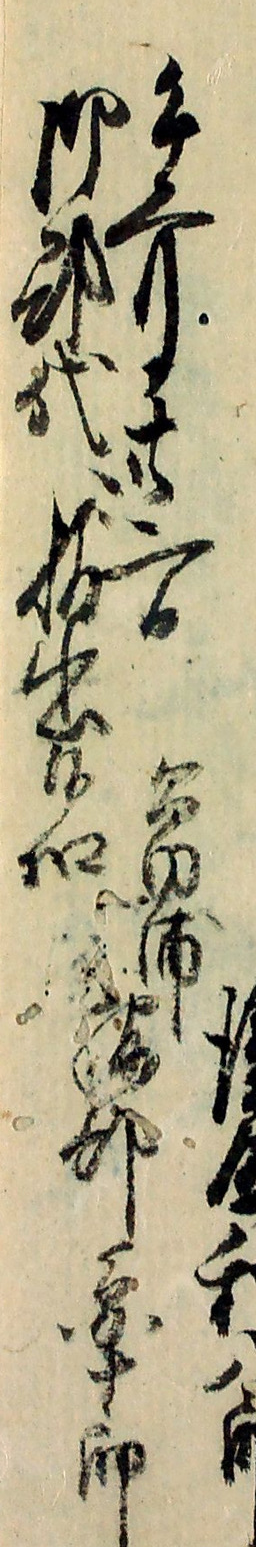御郡代へ指出候控
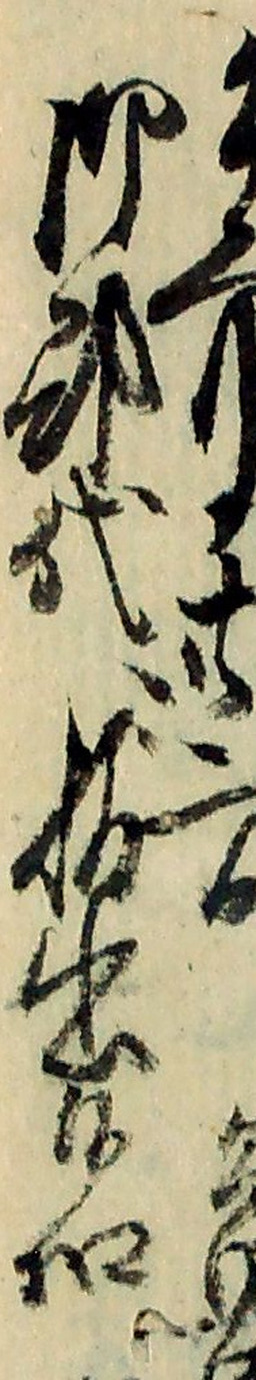御郡代へ指出候控
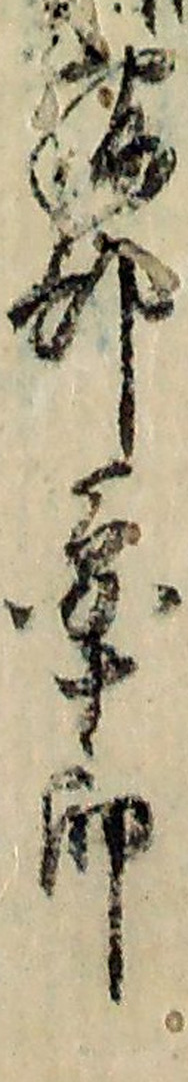服部円十郎

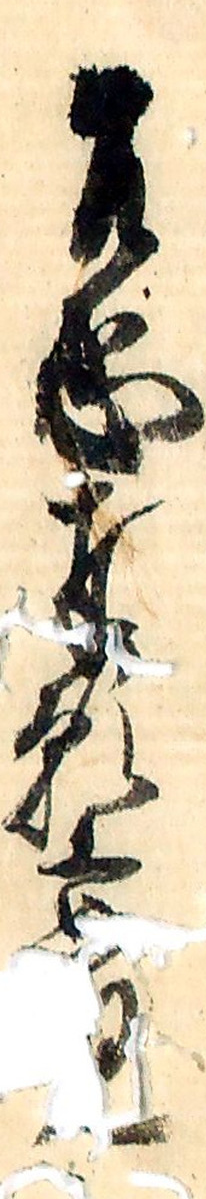乍恐奉願上覚
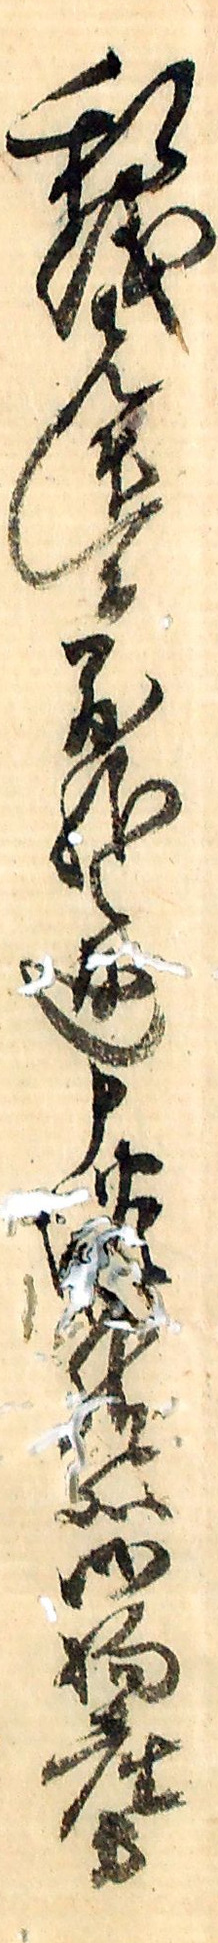私儀先達而別紙之通申談居候処御物産方
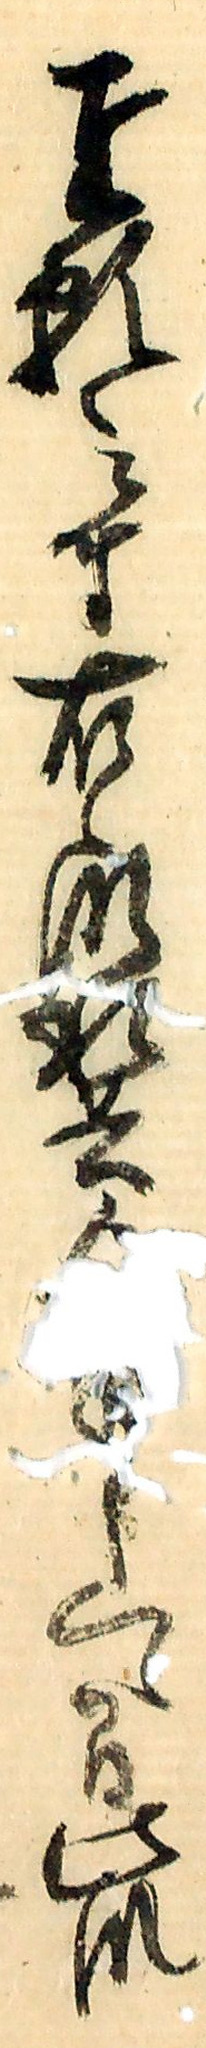奉願候に付右之段私共ゟ奉申上候間此段
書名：乍恐奉願上覚（御国産櫨植付並実取集売捌等)他
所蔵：鳴門教育大学 Naruto University of Education
